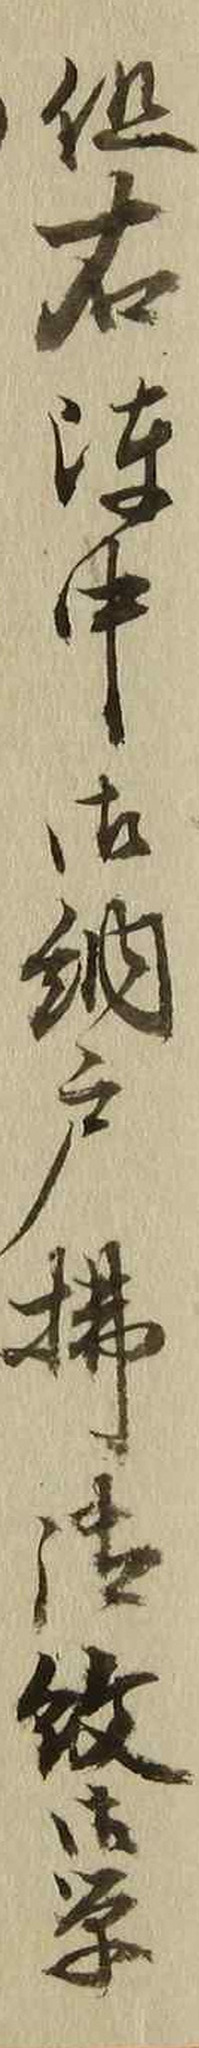但右陣中御納戸拂御紋御草
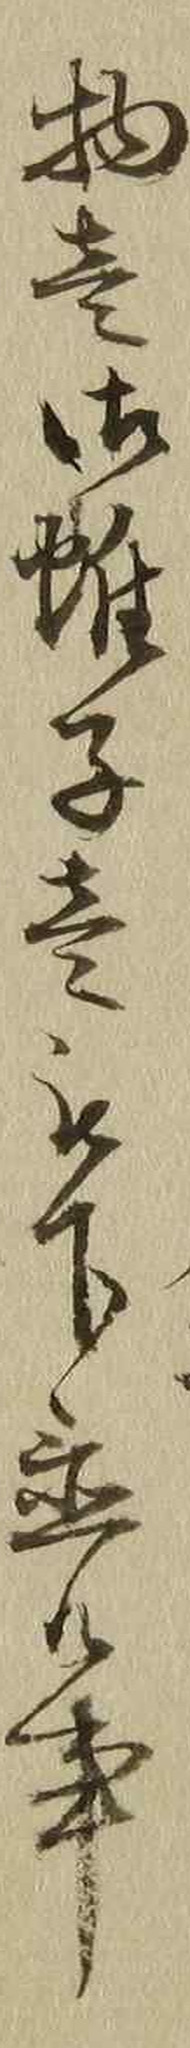物壱御帷子壱被下置候事
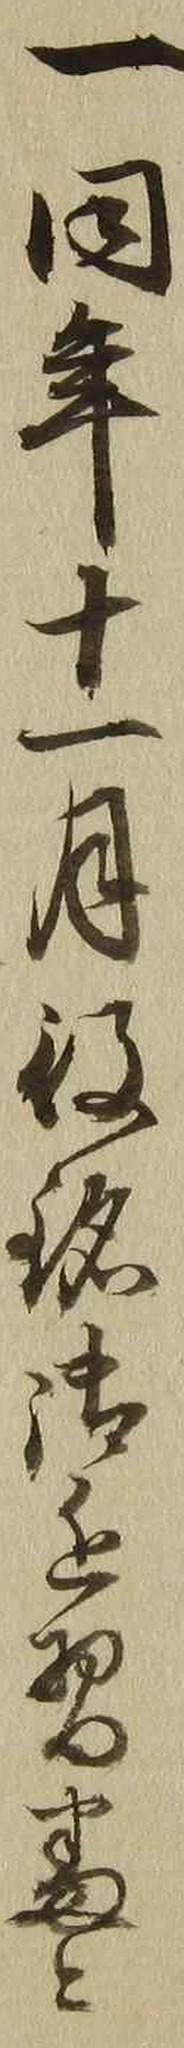一同年十一月役銘御進習番と
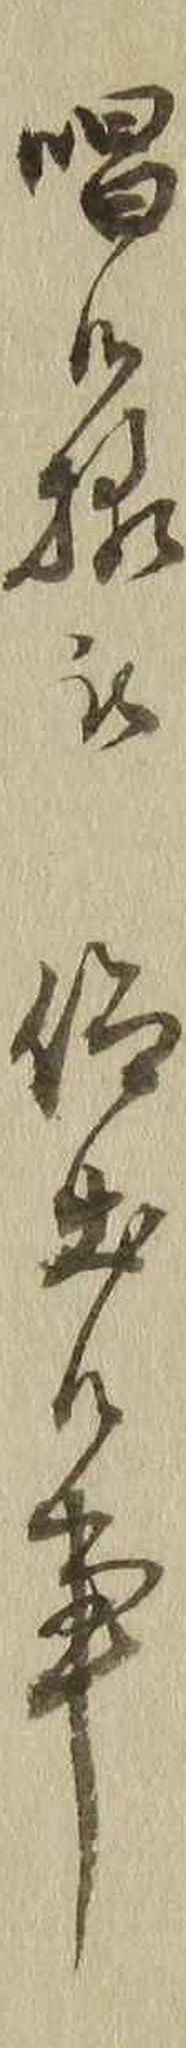唱候様被仰出候事
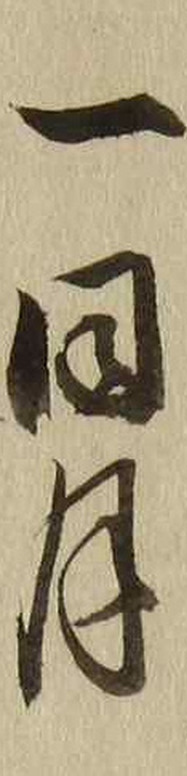一同月
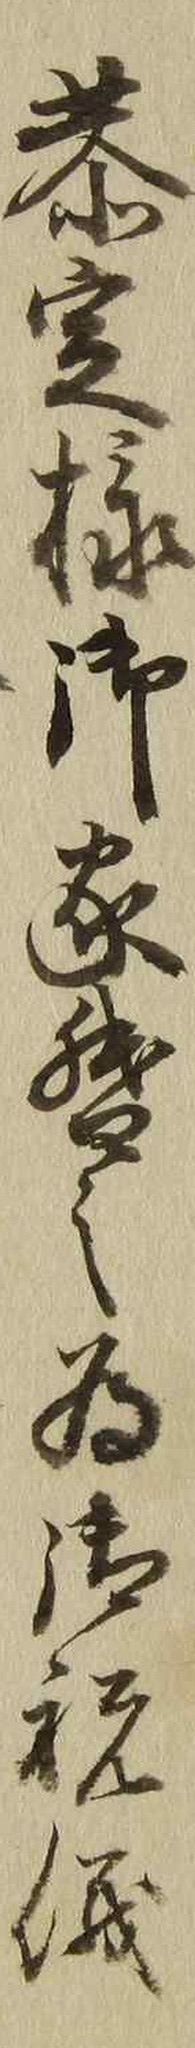恭定院様御家替之為御祝儀
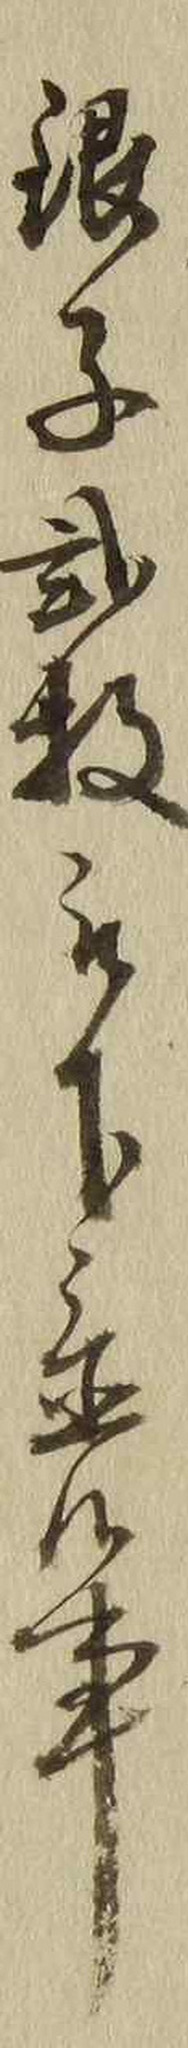銀子弐枚被下置候事
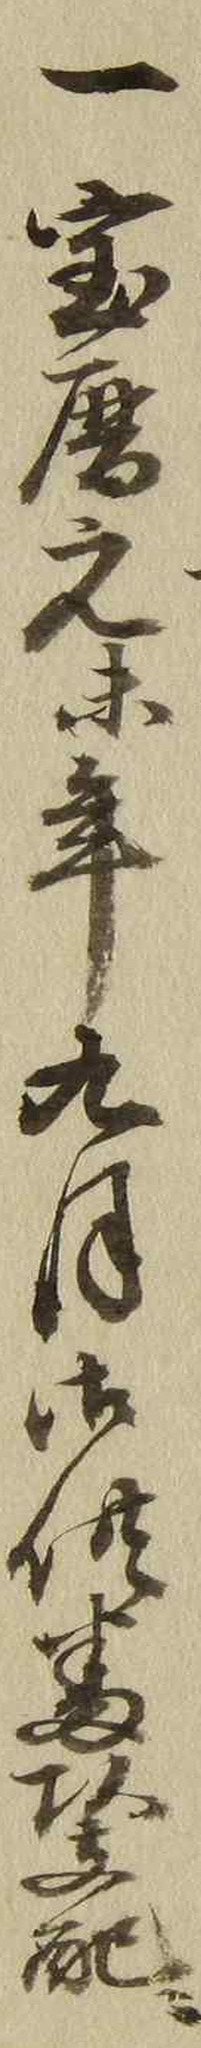一宝暦元未年九月御供番頭支配ニ
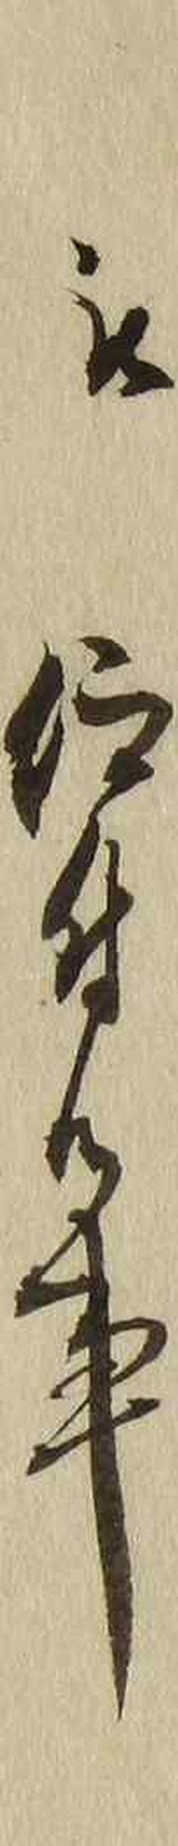被仰付候事
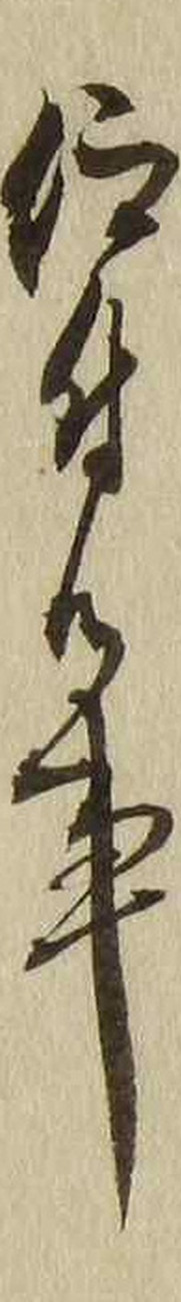仰付候事
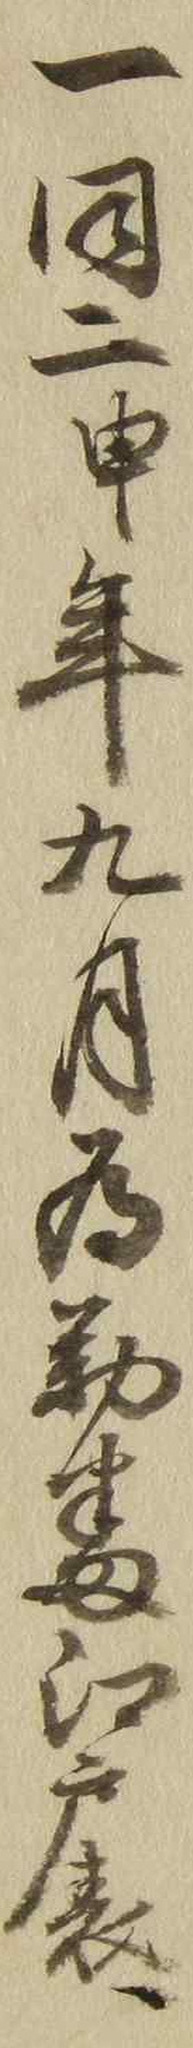一同二申年九月為勤番江戸表ヘ

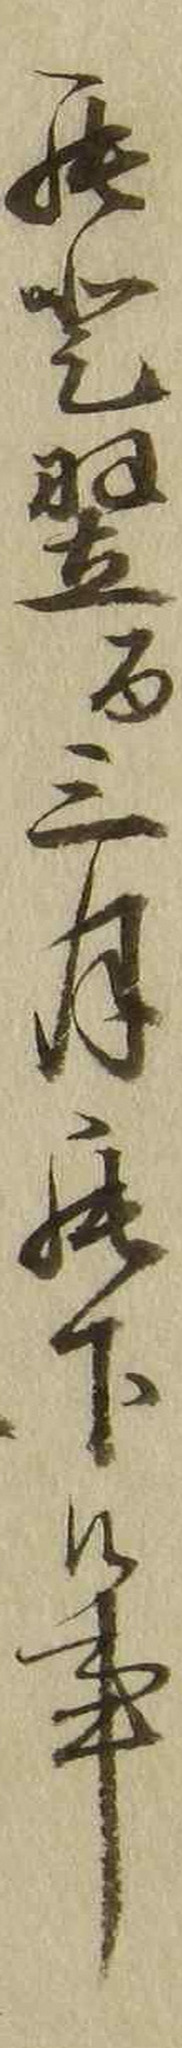罷登翌酉三月罷下候事
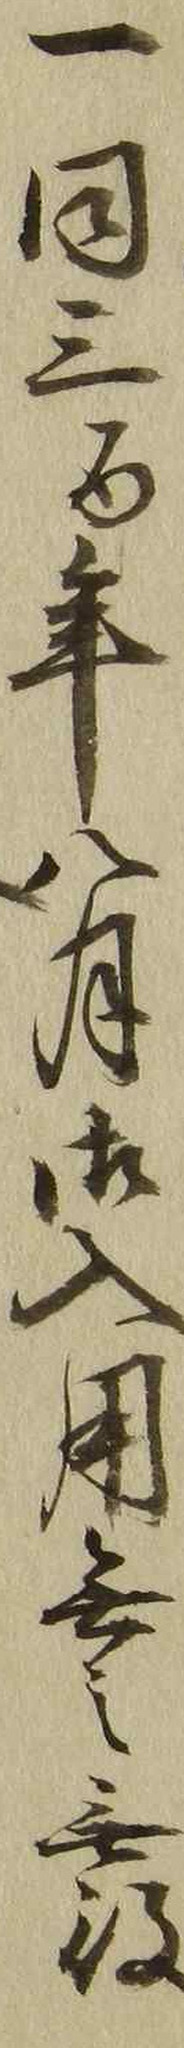一同三酉年八月御入用無之無役
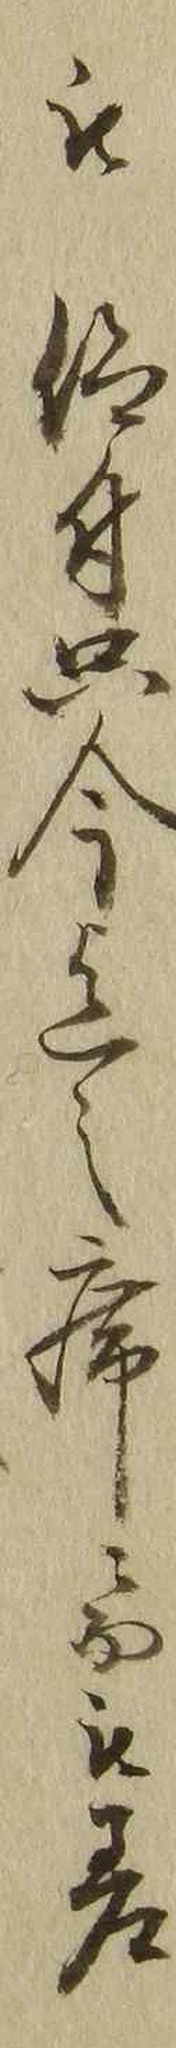被仰付只今迄之席ニ而被差
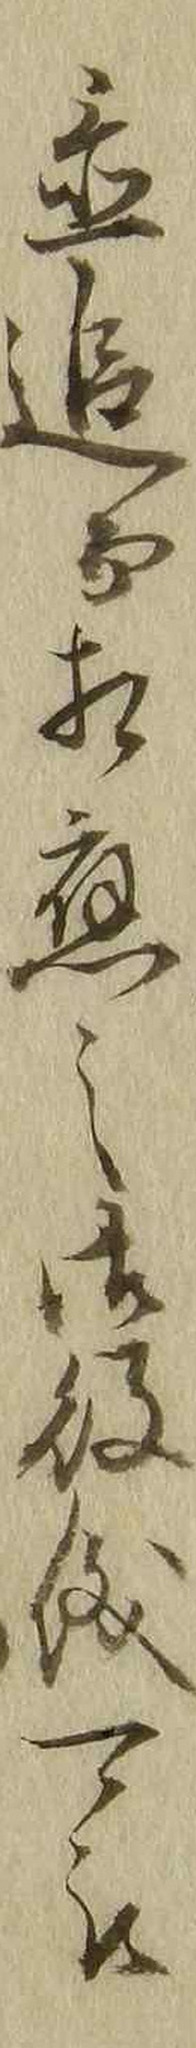置追而相応之御役儀可被
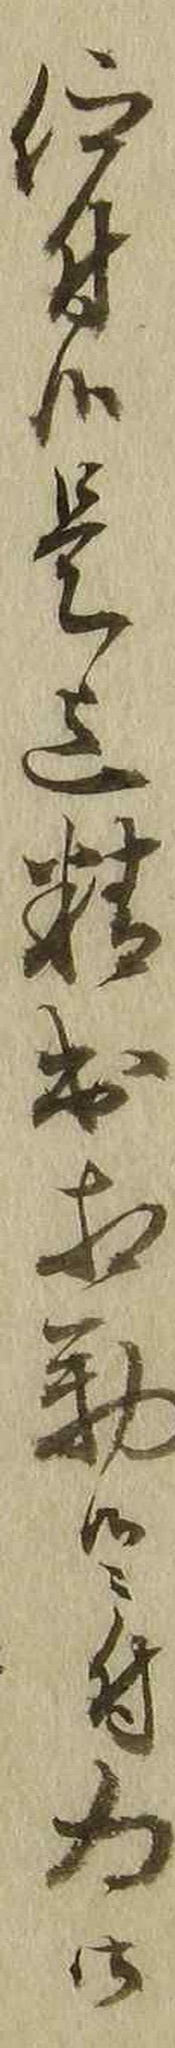仰付候是迄精出相勤候ニ付為御
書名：諸士系譜　巻之64　と之部7
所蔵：会津若松市立会津図書館
